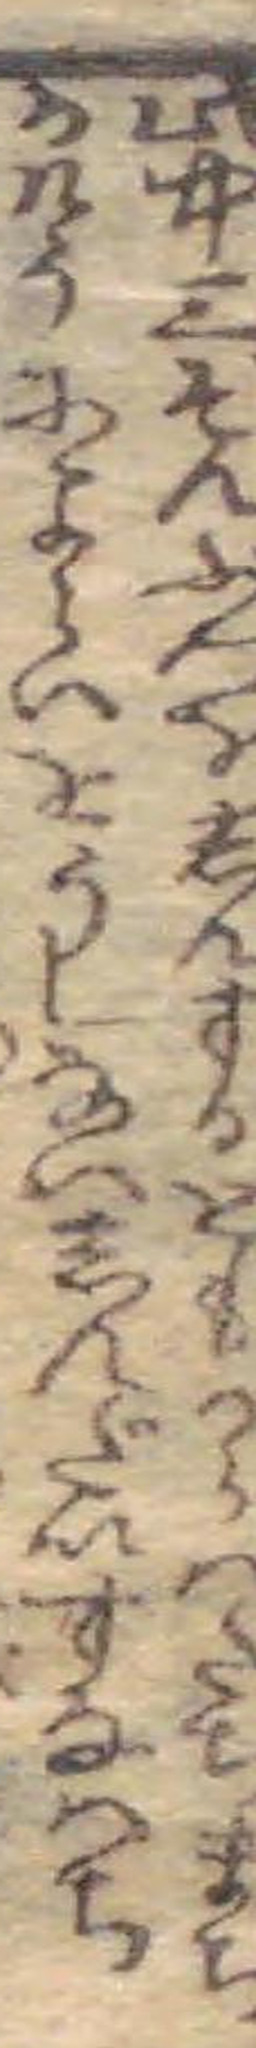かけうによらいをうしないしんだいすなはち
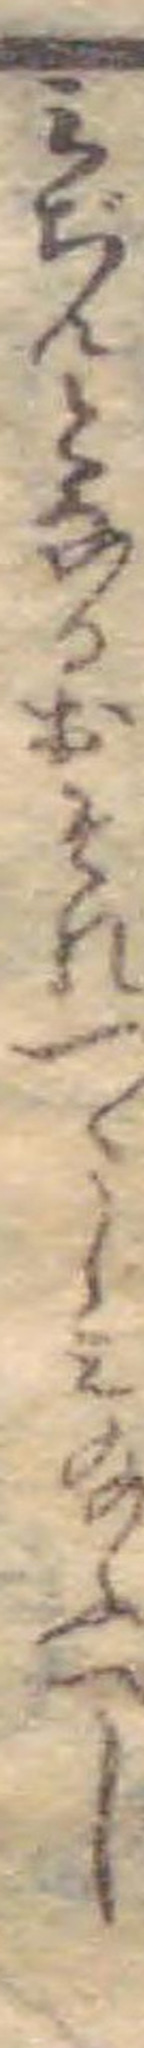みぢんとなるおそれつゝしみ給ふべし
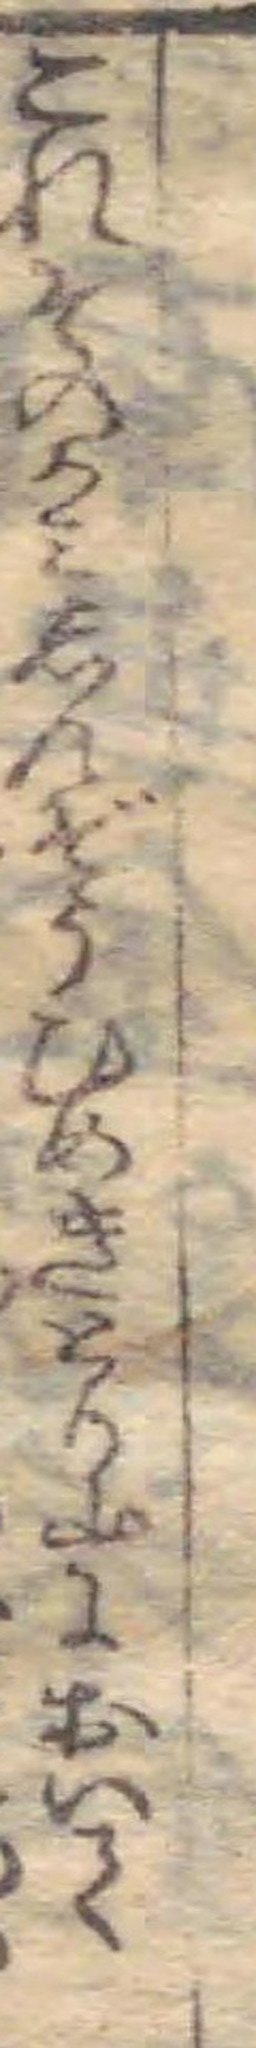これそのかみしんぞうひめきとり山において
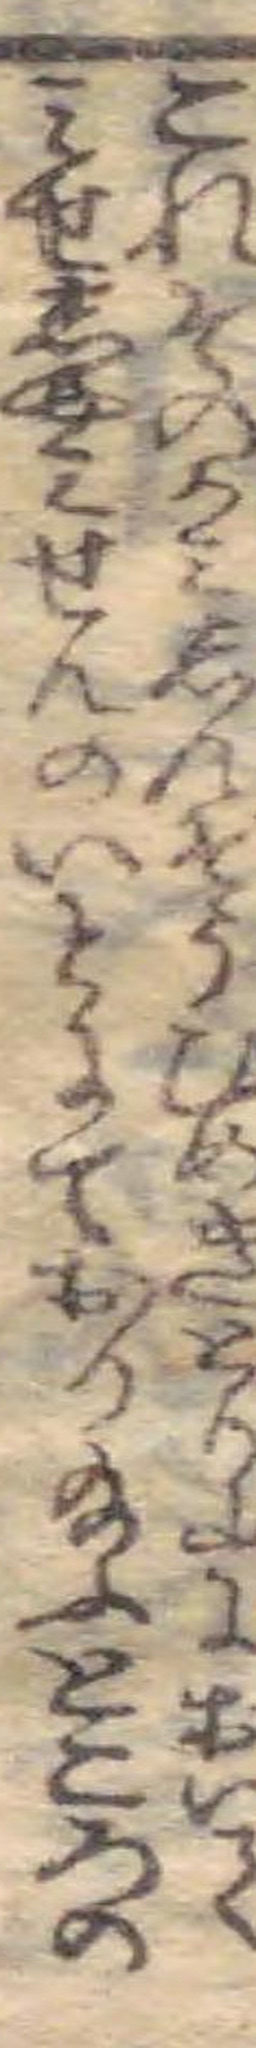みせしやみせんのいとにており給ふところの
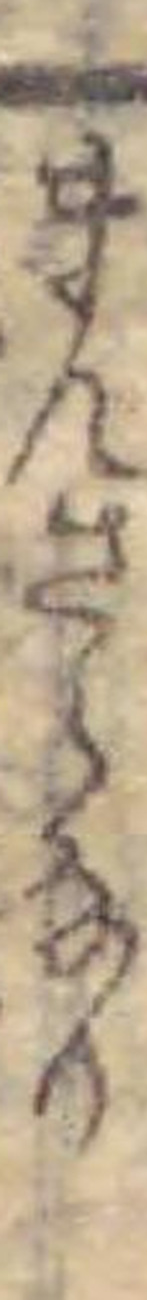まんさらなり
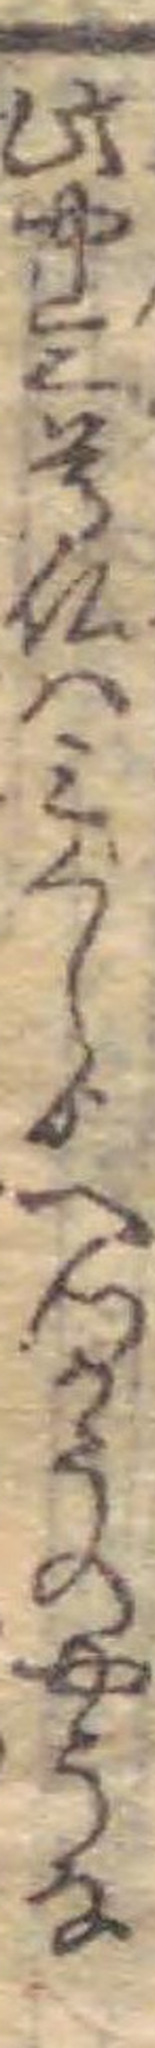此中三尊仏はみくしよりへつかうのやうな
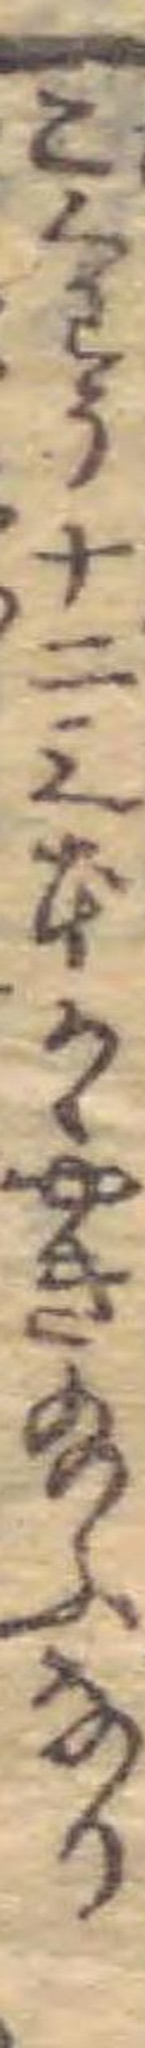こくわう十二三本かゝやき給ふなり
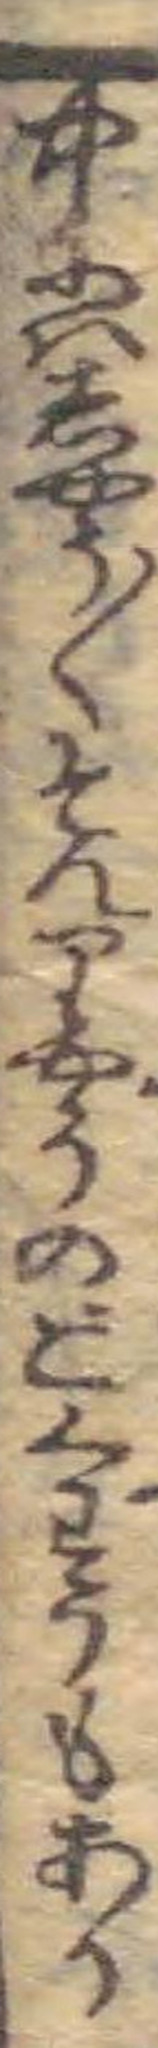中にはしやう〳〵そんりやうのごくわうもあり
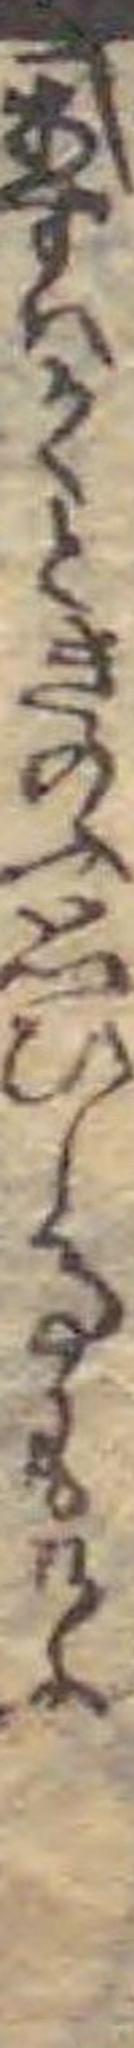〽あすはかくときのふ思ひし事もけふ
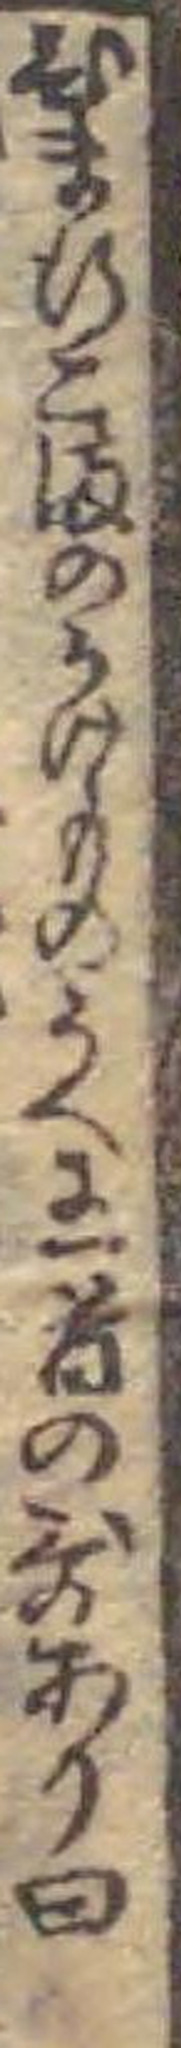ひま行こまのかけものうへに一首の哥あり曰
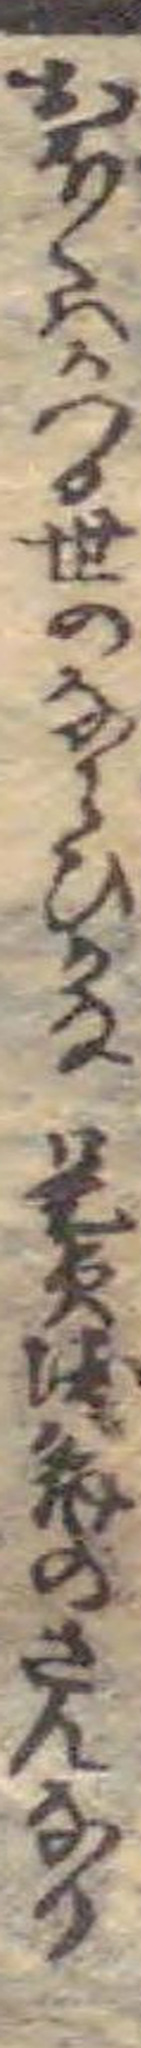おほくはかはる世のならひかな是買？徳？翁のさんなり
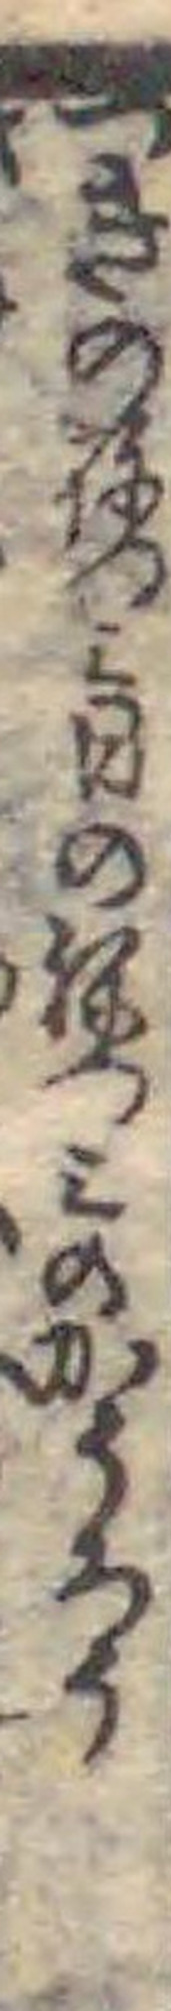つきのねつみ日のねつみのかうろう
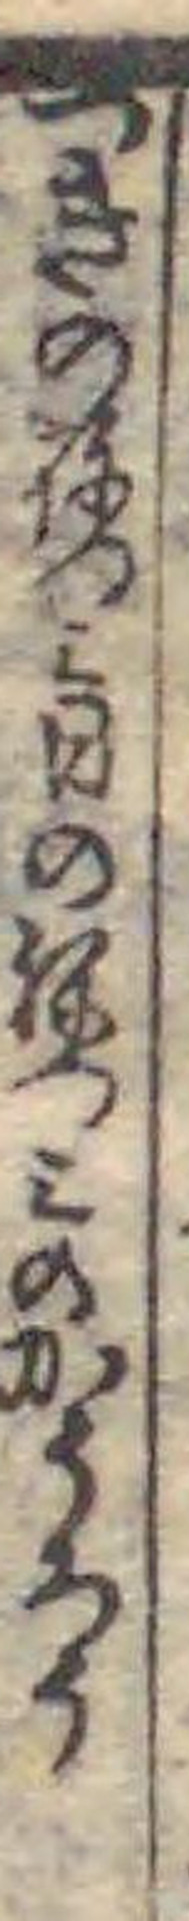つきのねつみ日のねつみのかうろう
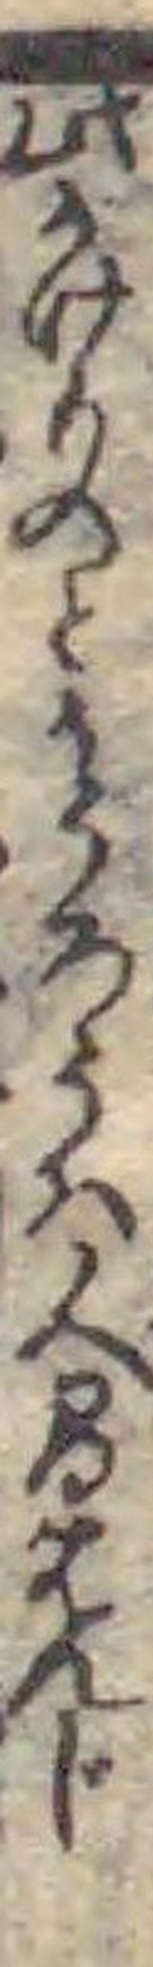此かけものとかうろうは人間はんじ
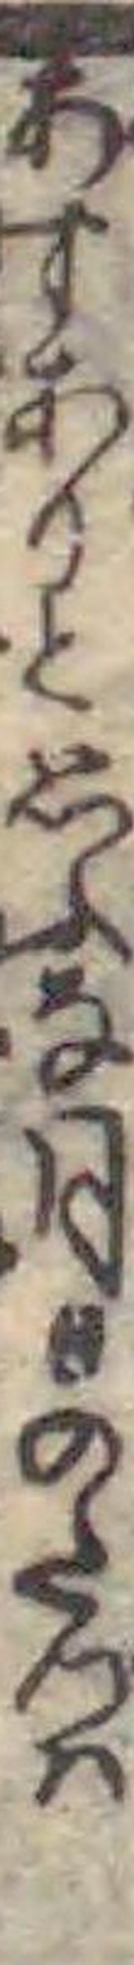あすありと思ふな月日のたつは
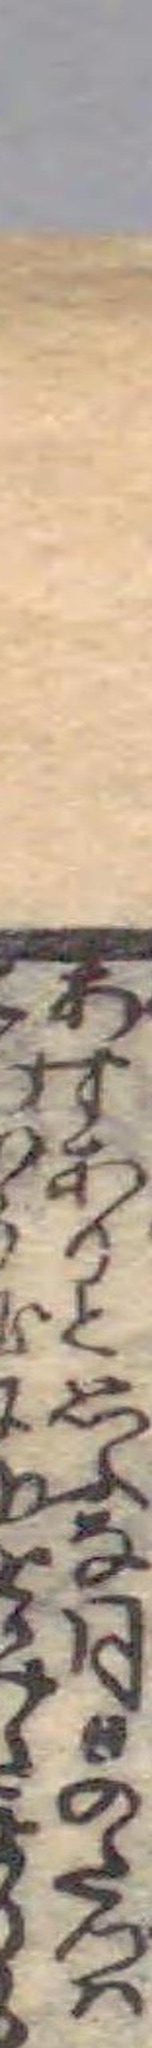あすありと思ふな月日のたつは
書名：身体開帳略縁起 : 3巻
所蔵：国立国会図書館 National Diet Library, JAPAN
